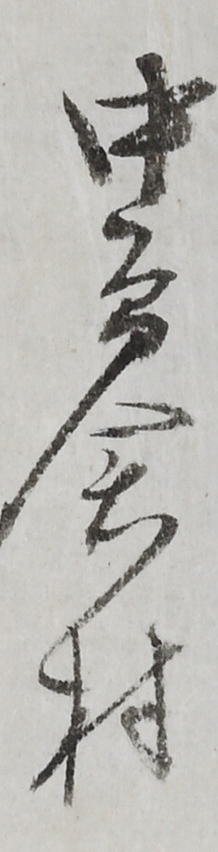中曽蔵村
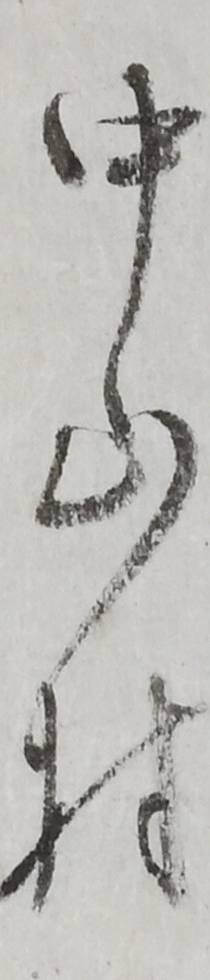中山村
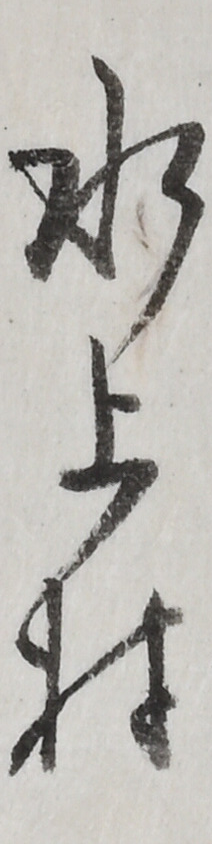水上村
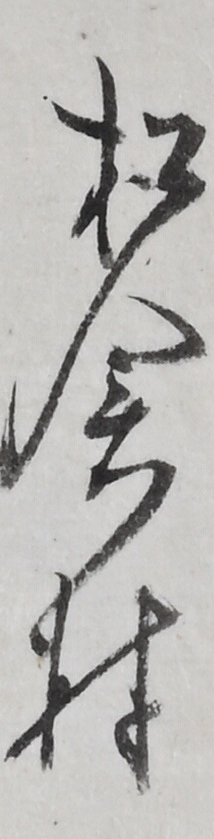松倉村
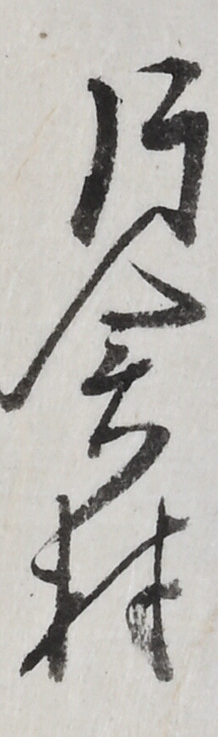片倉村
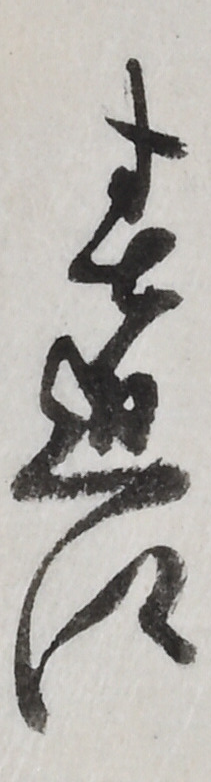春近郷
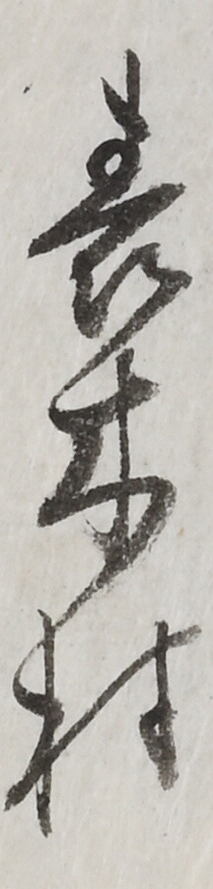表木村
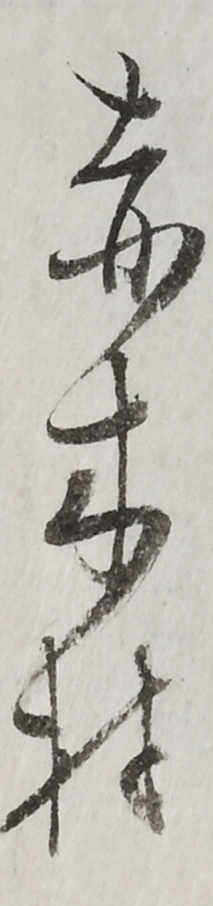赤木村
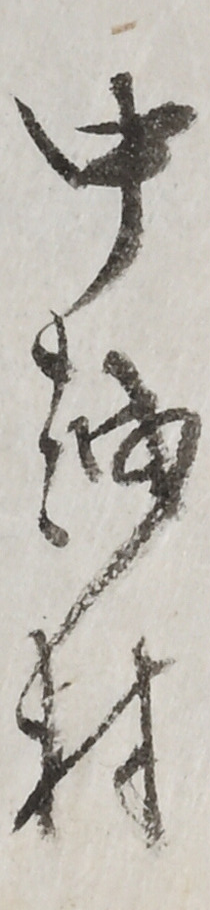中越村
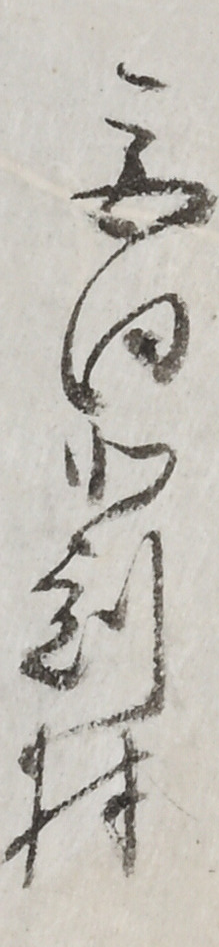宮田北割村
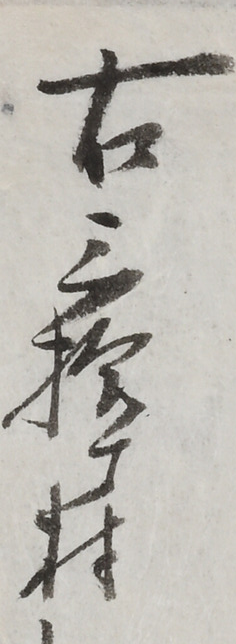右三拾ヶ村
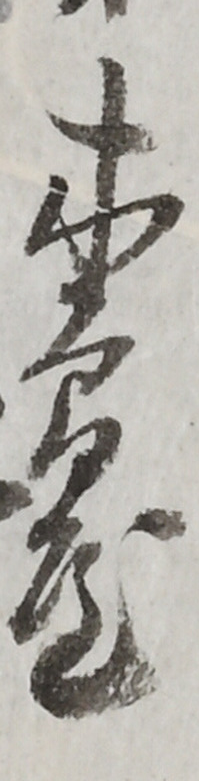木曽屋
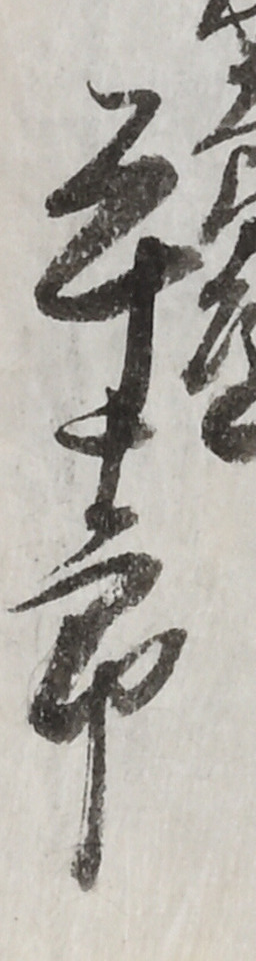平十郎

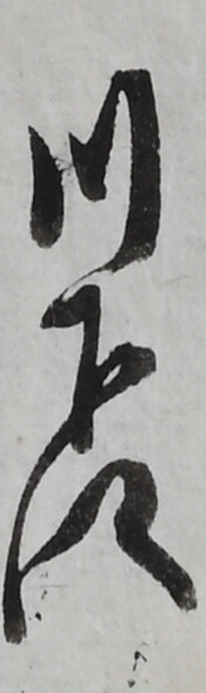川下郷
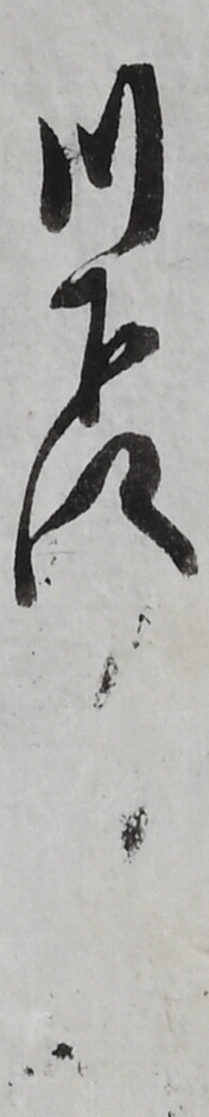川下郷
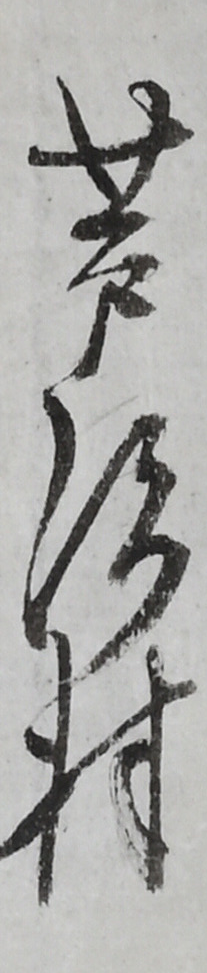芦沢村
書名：年内行事帳
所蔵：伊那市立高遠町図書館・合同会社AMANE
